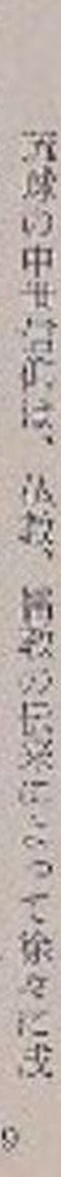琉球の中世信仰は、仏教、儒教の伝来によって徐々に成
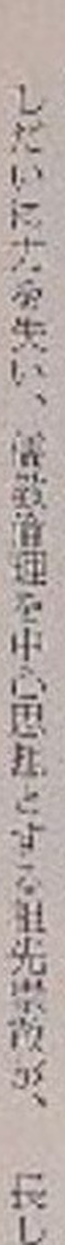しだいに力を失い、儒教倫理を中心思想とする祖先崇敬が、
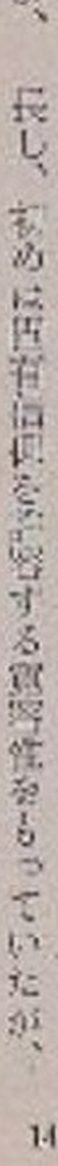長し、初めは固有信仰を許容する寛容性をもっていたが、

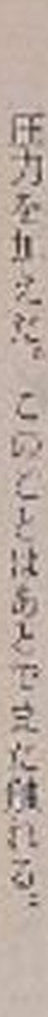圧力を加えた。このことはあとでまた触れる。
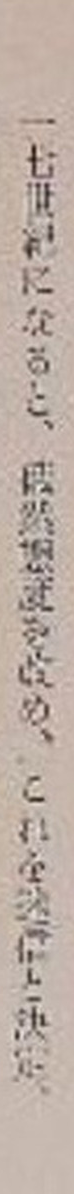一七世紀になると、然態度を改め、これを迷信と決定、
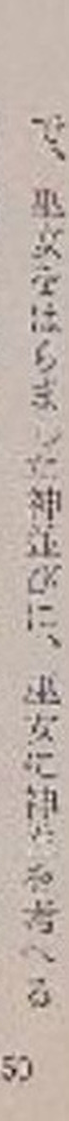で、巫女をはらました神並びに、巫女に神性を考へる
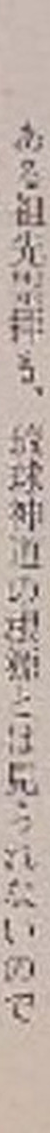ある祖先崇拝も、琉球神道の根源とは見られないので
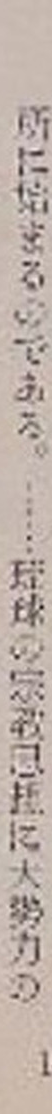所に始まるのである。……琉球の宗教思想に大勢力の
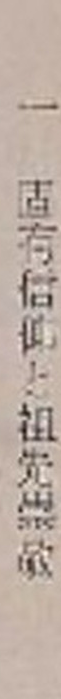一固有信仰と祖先崇敬
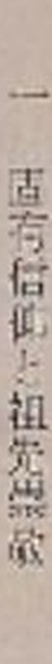一固有信仰と祖先崇敬
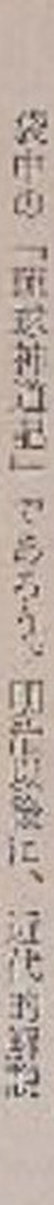袋中の『琉球神道記』であろう。明治以後に、近代的解説
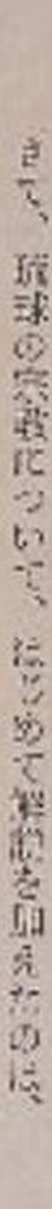さて、琉球の宗教について、はじめて解説を加えたのは、
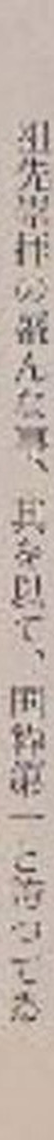祖先崇拝の盛んな事、其を以て、国粋第一と誇つてゐ
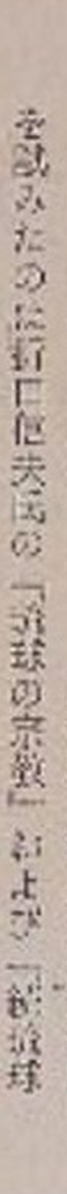を試みたのは折口信夫氏の『琉球の宗教』および『続琉球
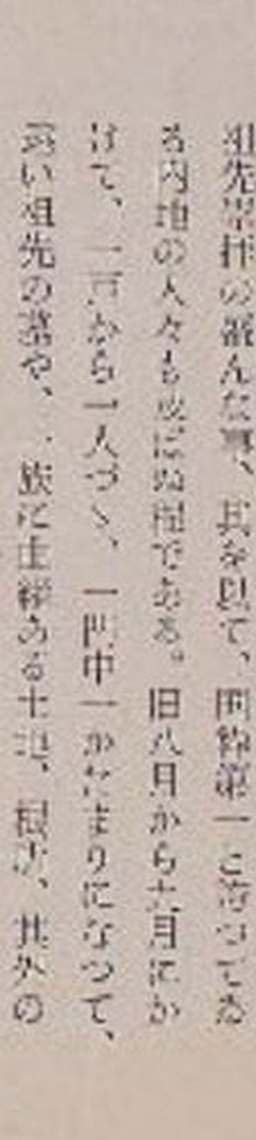けて、一戸から一人づゝ、一門中一かたまりになつて、
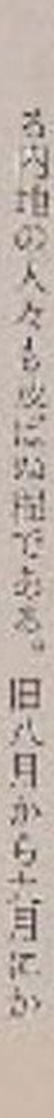る内地の人々も及ばぬ程である。旧八月から九月にか
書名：沖縄固有信仰のおとろえ
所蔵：University of the Ryukyus Library
